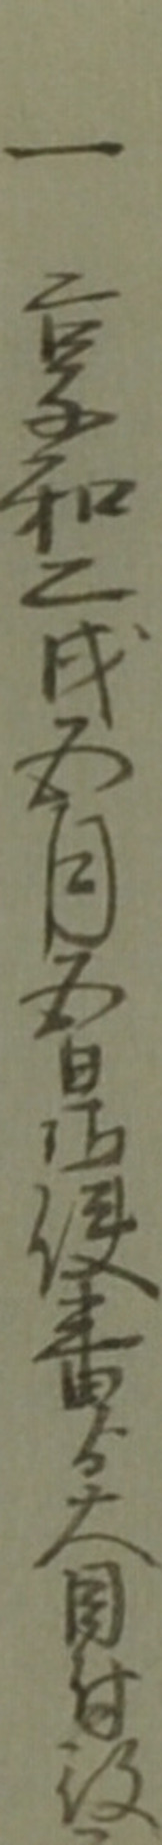一享和二戌五月五日御使番ゟ大目付役被仰付
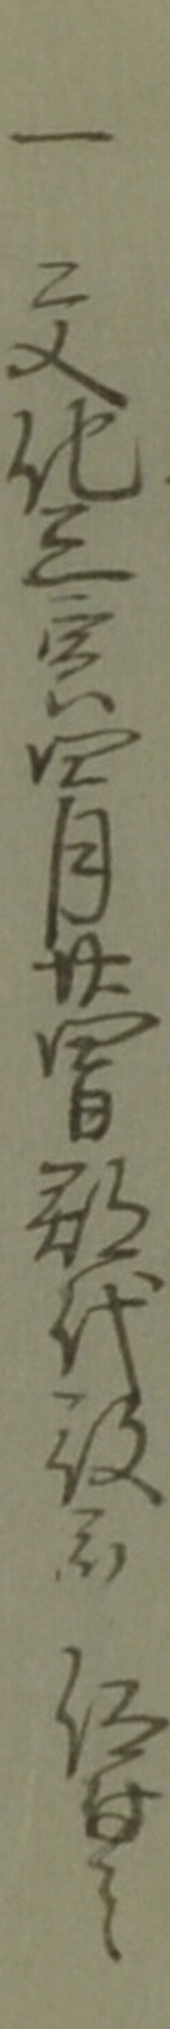一文化三寅四月廿四日郡代役被仰付之
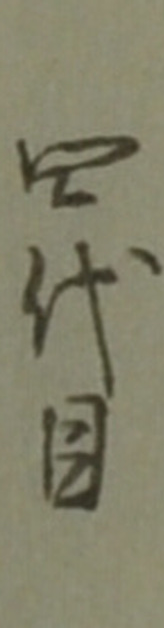四代目
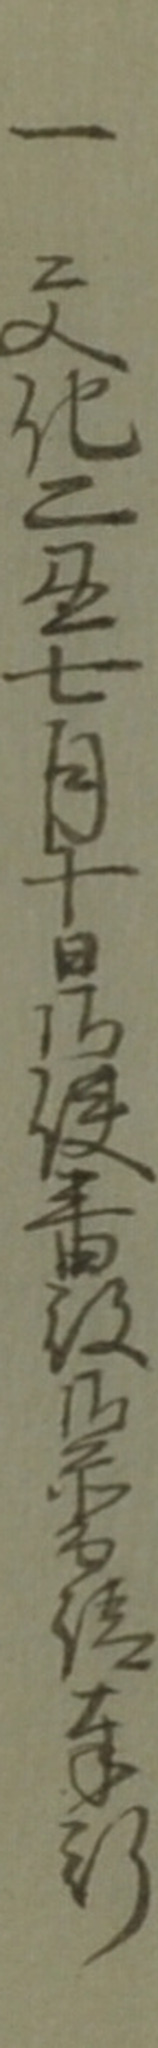一文化二丑七月十日御使番役御普請奉行
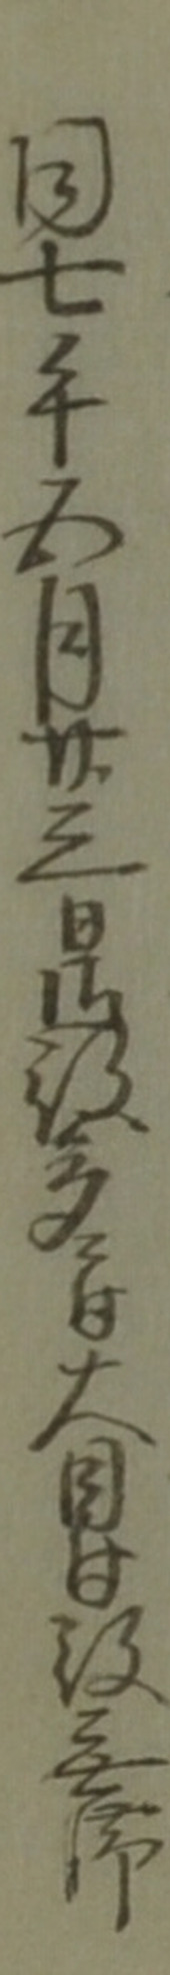一同七午五月廿三日御役多ニ付大目付役無滞
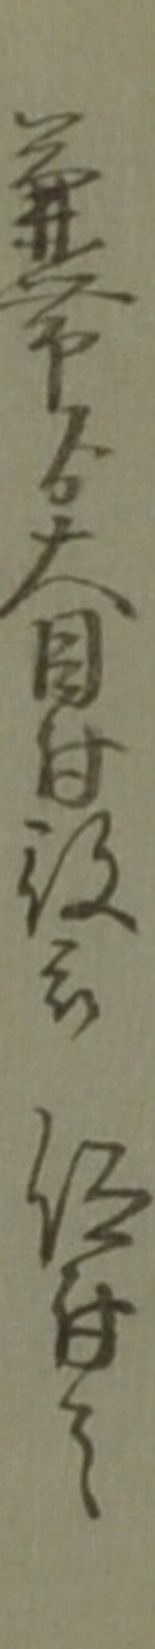兼帯ゟ大目付役被仰付之
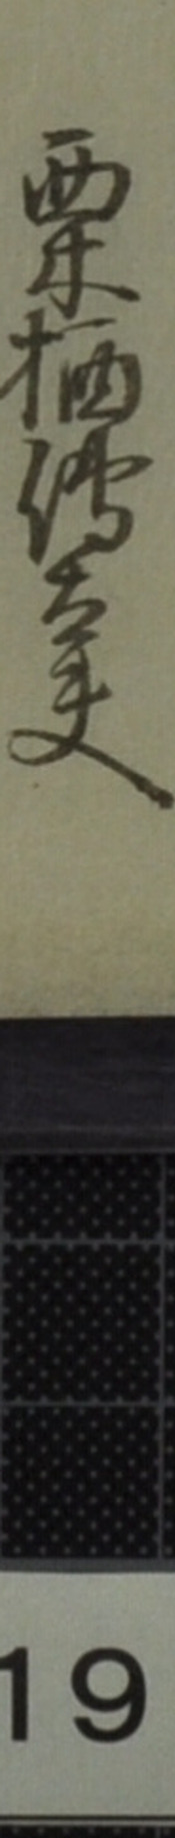栗栖伝太夫
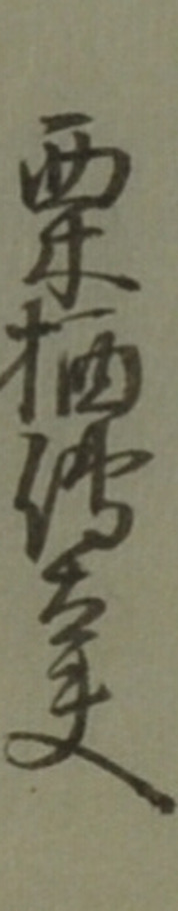栗栖伝太夫
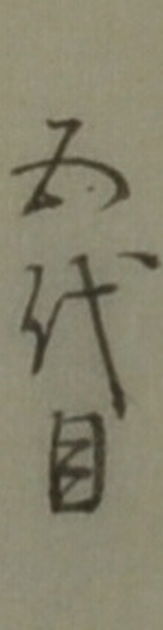五代目
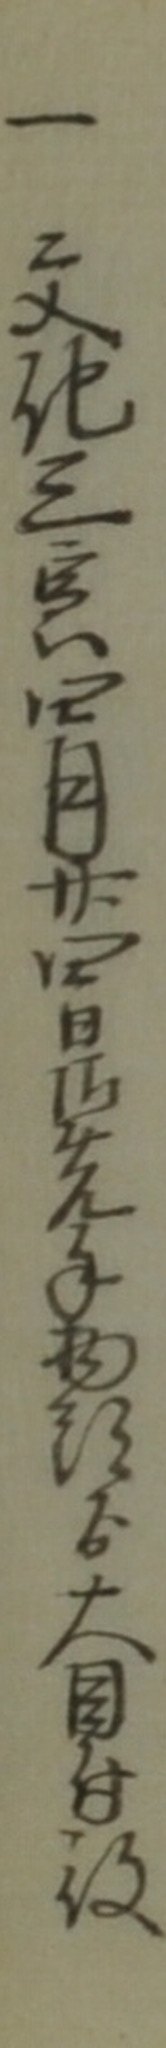一文化三寅四月廿四日御先手物頭ゟ大目付役
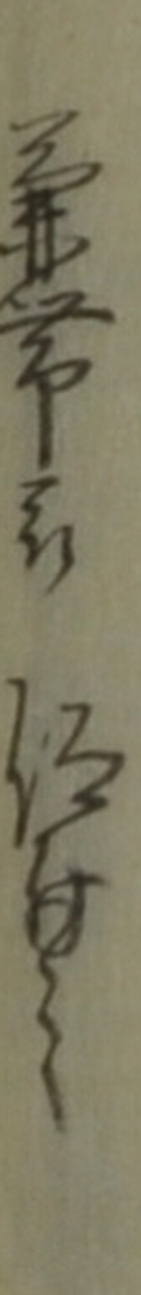兼帯被仰付之
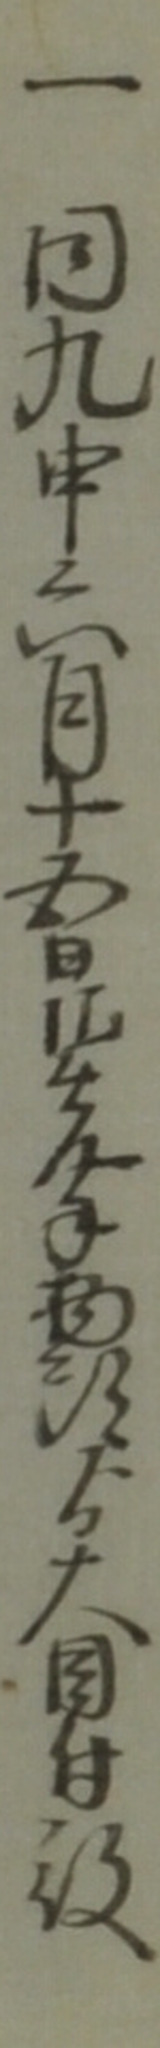一同九申六月十五日御先手物頭ゟ大目付役
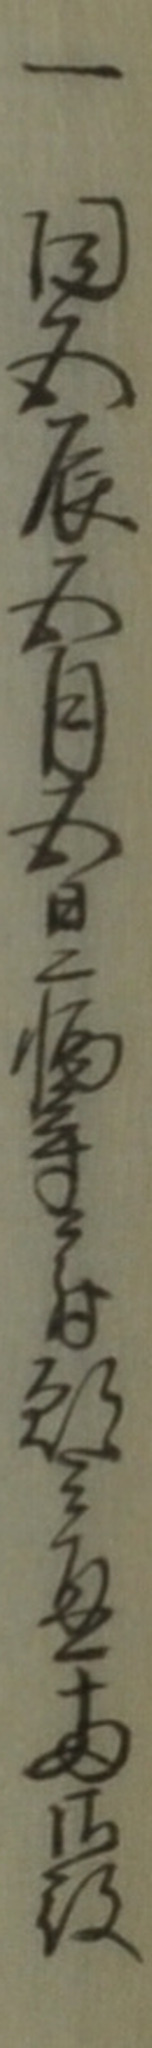一同五辰五月五日病気ニ付願之通両御役
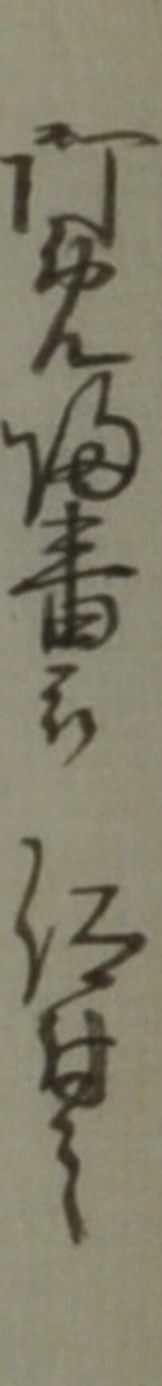御免帰番被仰付之
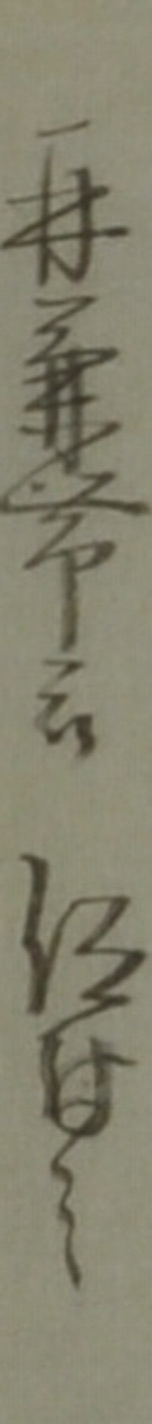再兼帯被仰付之
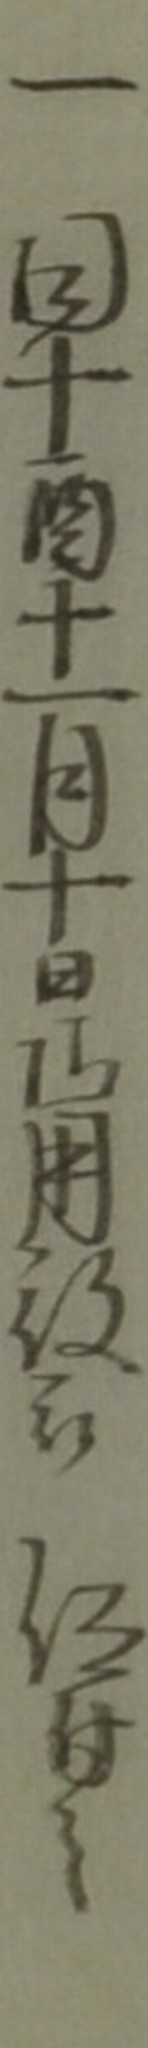一同十酉十一月十日御用役被仰付之
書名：諸御役代々録（三）
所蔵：伊那市立高遠町図書館・合同会社AMANE
